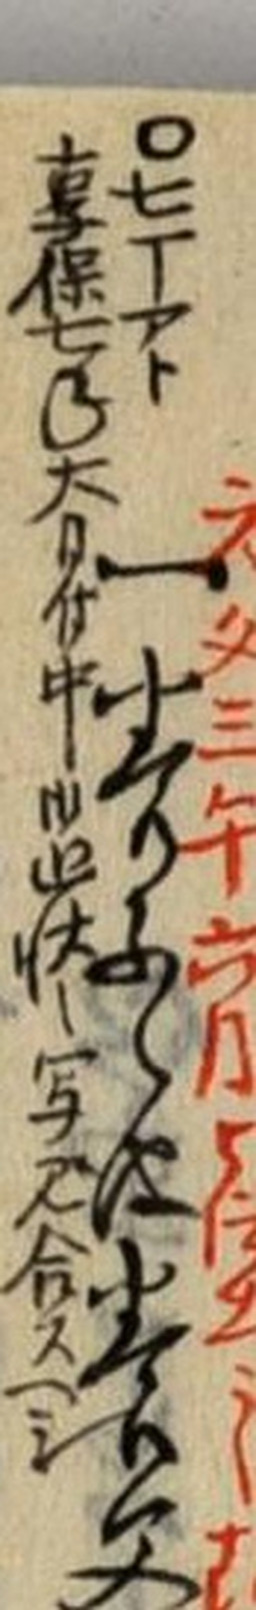享保七年大目付中御廻状之写見合すへし
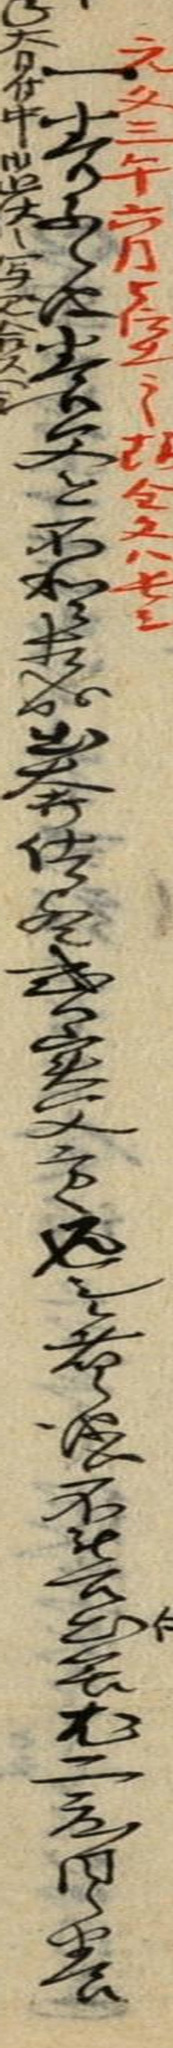一養子之儀養父と不和に相成出奔仕候歟或は実父方へ返し候者之儀は不被召出筈尤二度目之養
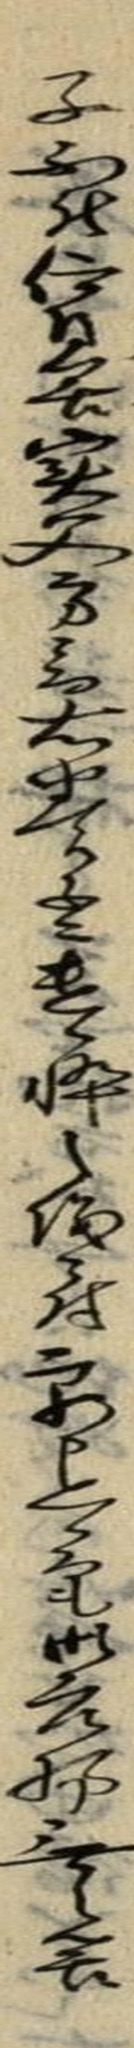子不被仰付筈実父方ニ而右養子に遣候忰之儀ニ付願申上候而も御差揚無之筈
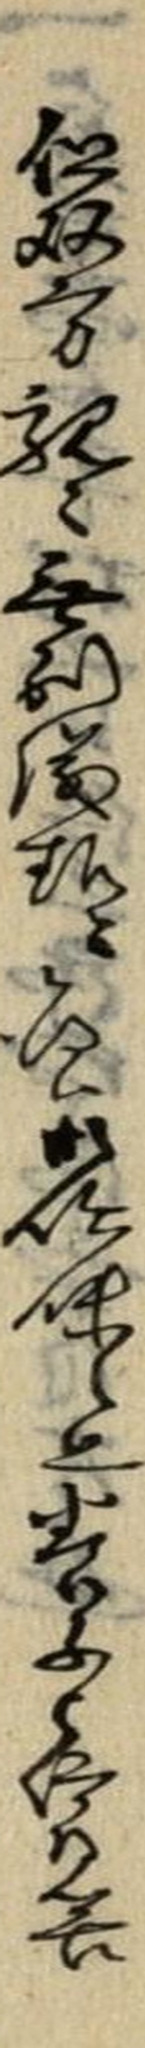但双方親に無別儀趣に候得は御吟味之上養子被仰付筈
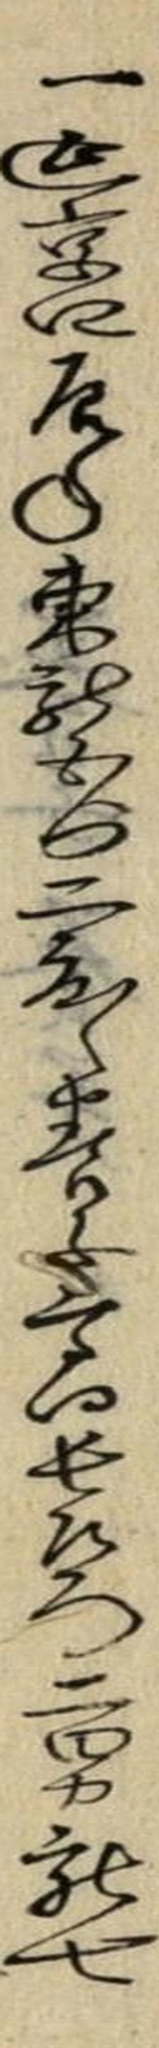一延享四辰年東新五右衛門二度之養子高田長左衛門二男新七
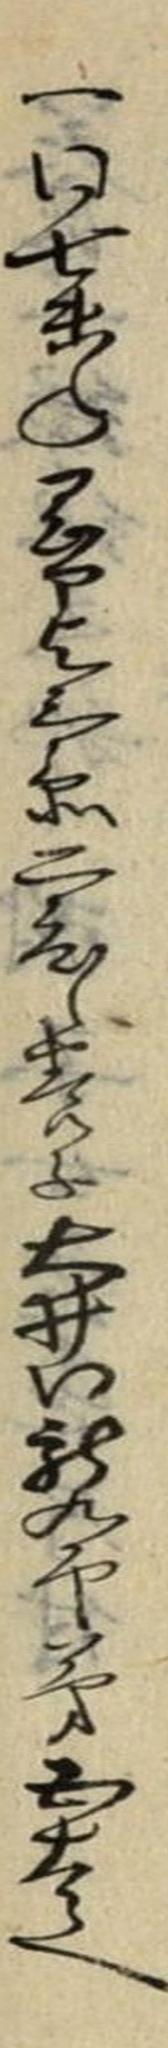一同七未年岡部与三兵衛二度之養子大井田新九郎弟五太夫
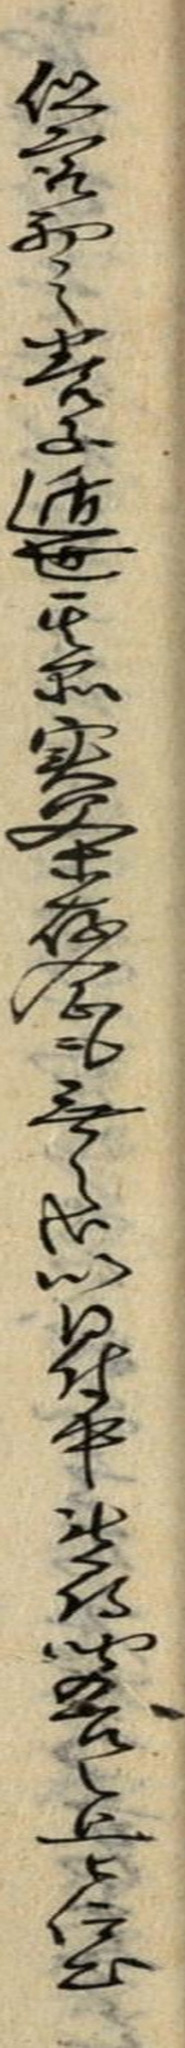但最初之養子遁世其品実父等存念も無之哉以目付中被尋聞召之上被仰出
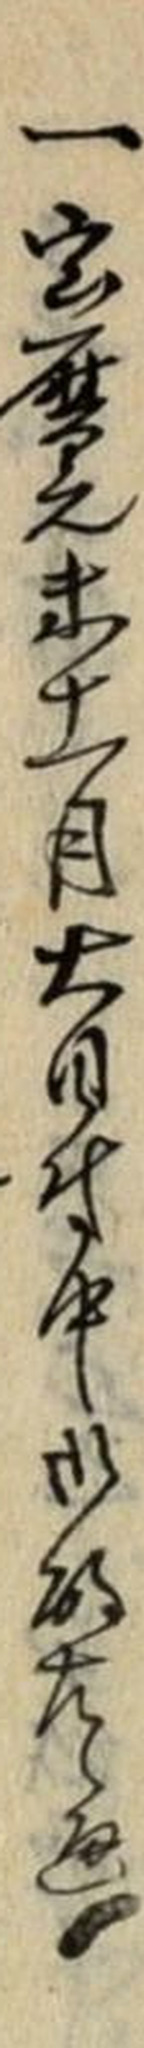一宝暦元未十一月大目付中御触左之通
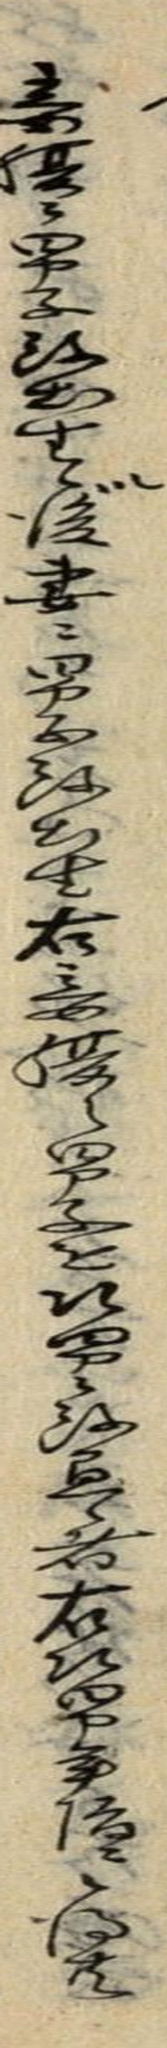妾腹に男子致出生候以後妻に男子致出生右妾腹之男子を次男に致置候者右次男年増に候得共
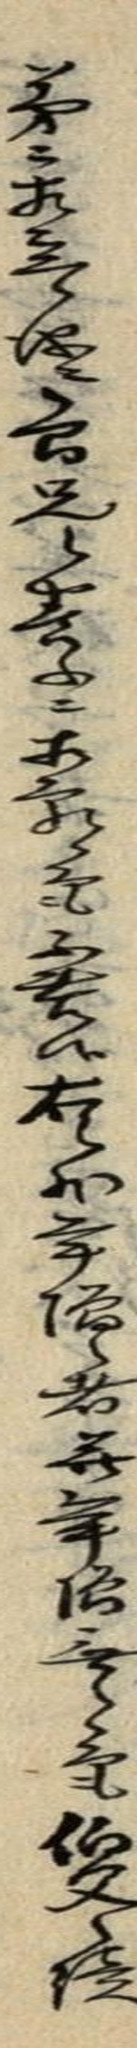弟に相立候儀に候間兄之養子に相願候而も不苦候右之外年増之者并年増無之候而も伯父之続
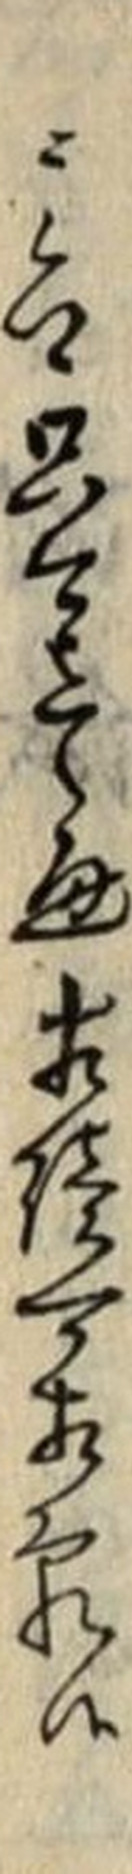に候はゝ只今迄之通相続可相願候
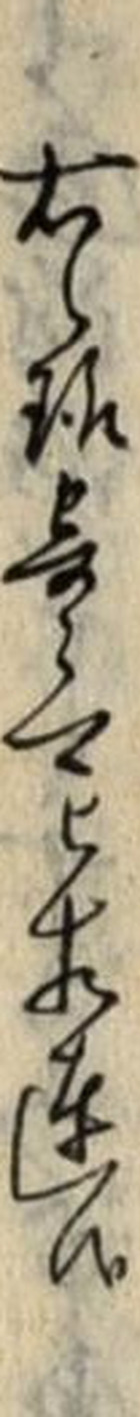右之趣寄々可被相達候
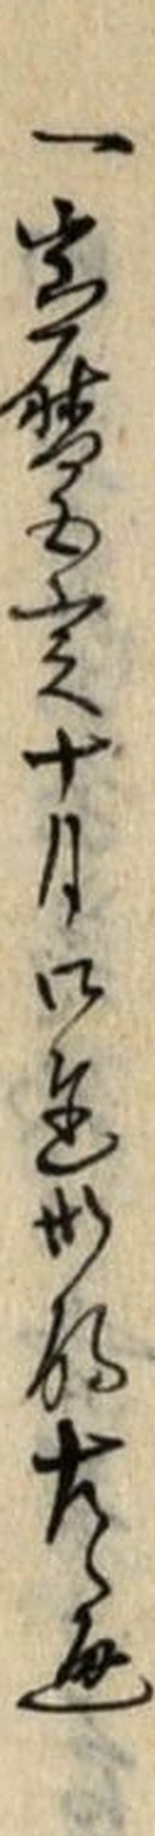一宝暦五亥十月口達御触左之通
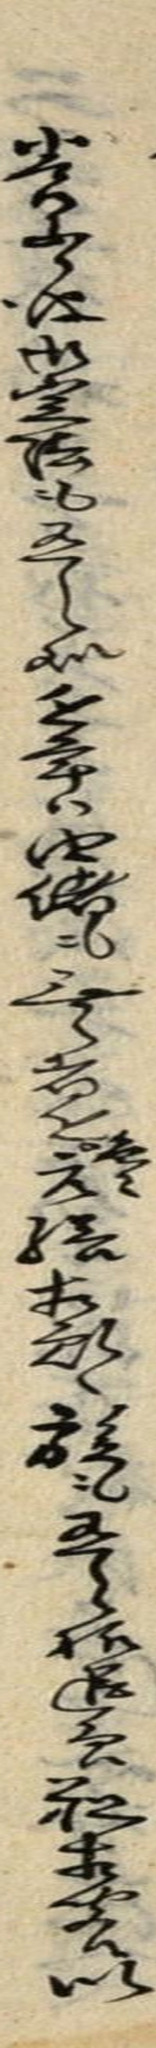養子之儀御定法も有之候処近年は由緒も無之者を色々取繕相願候族も有之候様追而は粗相聞候以
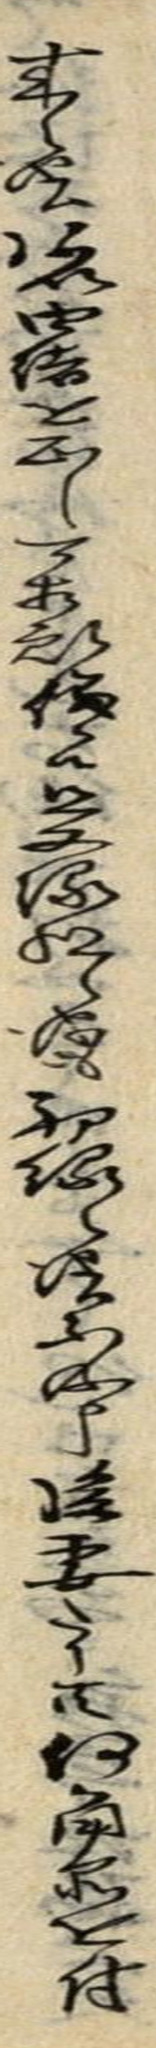来之儀は弥以由緒を正し可相願儀に候且又縁組之儀も初縁之儀は不及申後妻たり共何角品を付
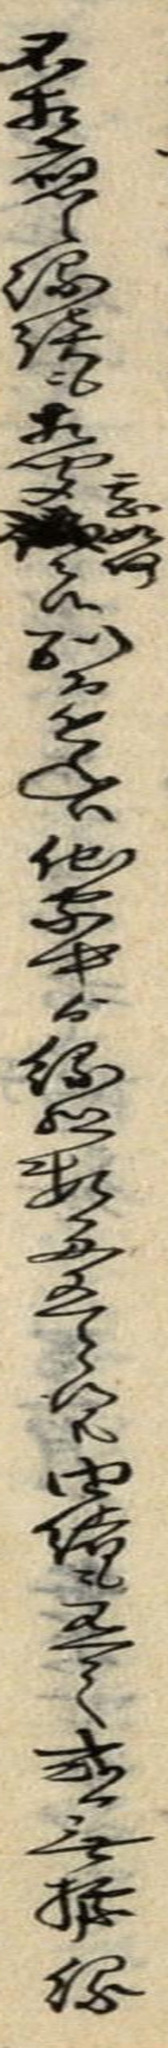不相応之縁談も相聞甚如何に候別而近年は他家中ゟ縁組数多有之候得共由緒も有之或は無拠縁
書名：養子縁組之部
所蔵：福井県文書館 Fukui Prefectural Archives
